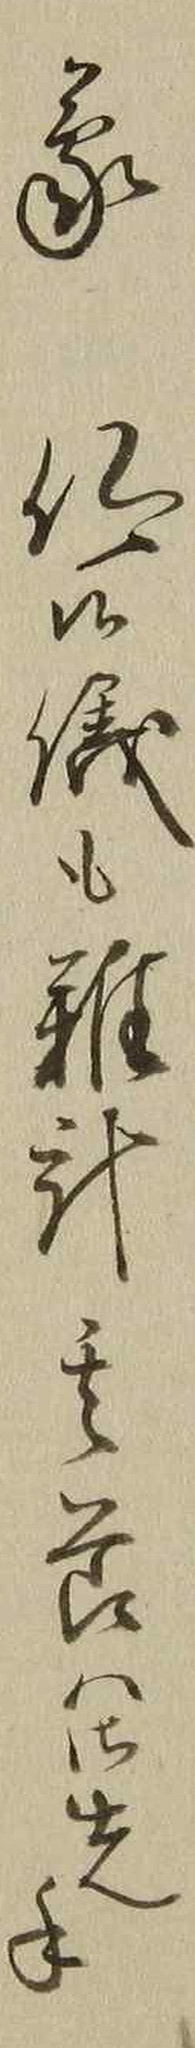蒙仰候儀も難計其節は御先手
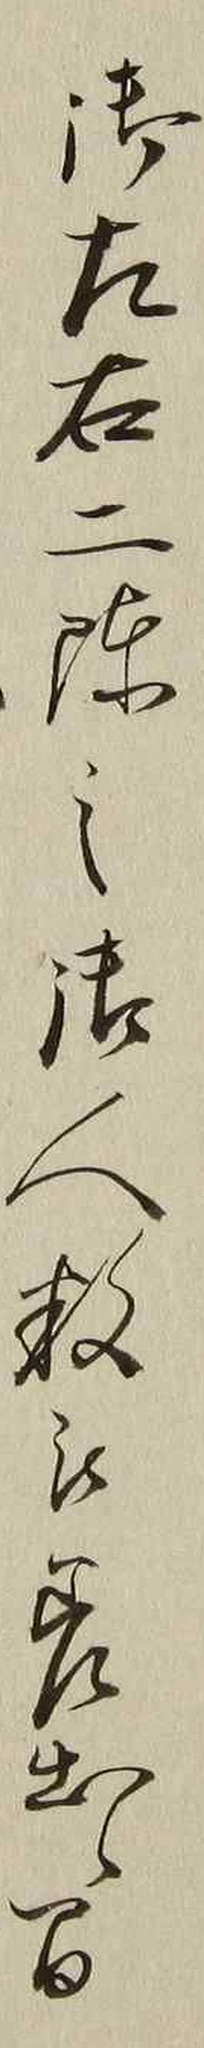御左右二陣之御人数被差出候間
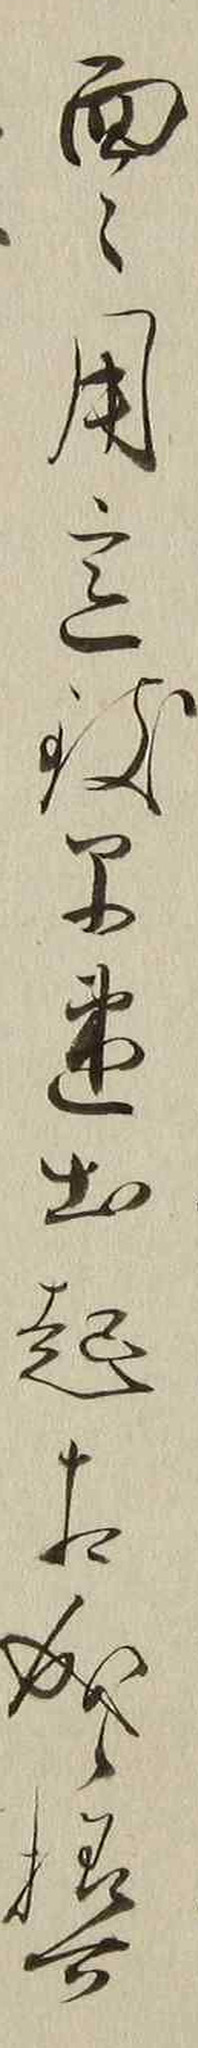面々用意致早迷出起相成候様可
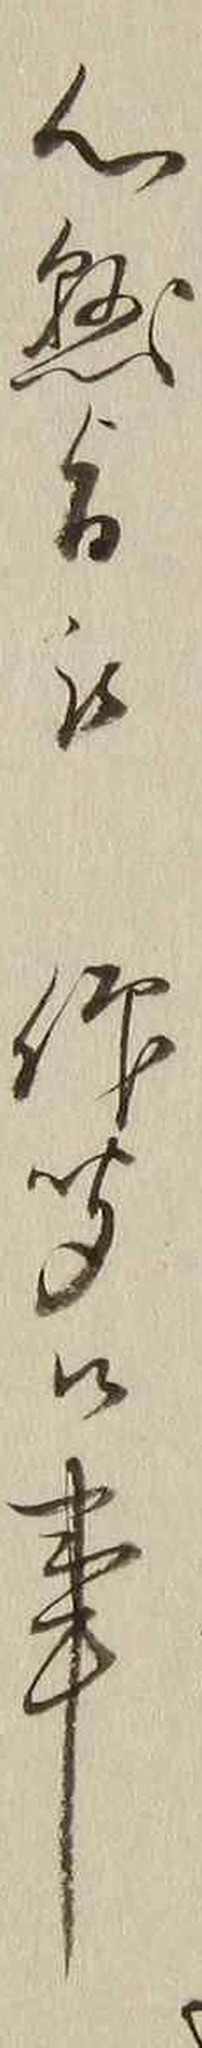心懸旨被仰聞候事
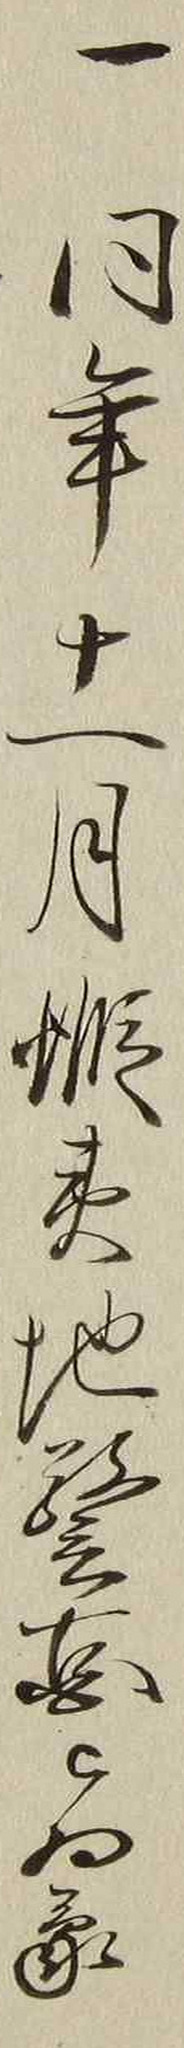一同年十一月蝦夷地警固被為蒙
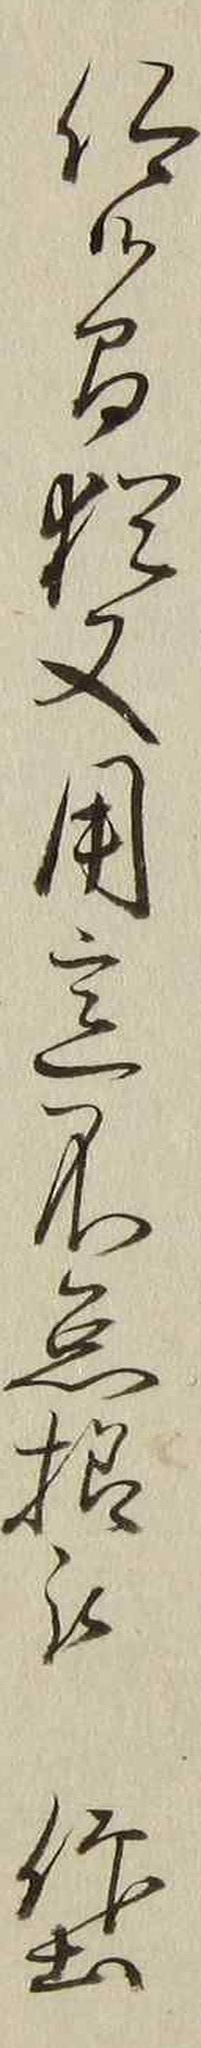仰候間猶又用意不怠様被仰出
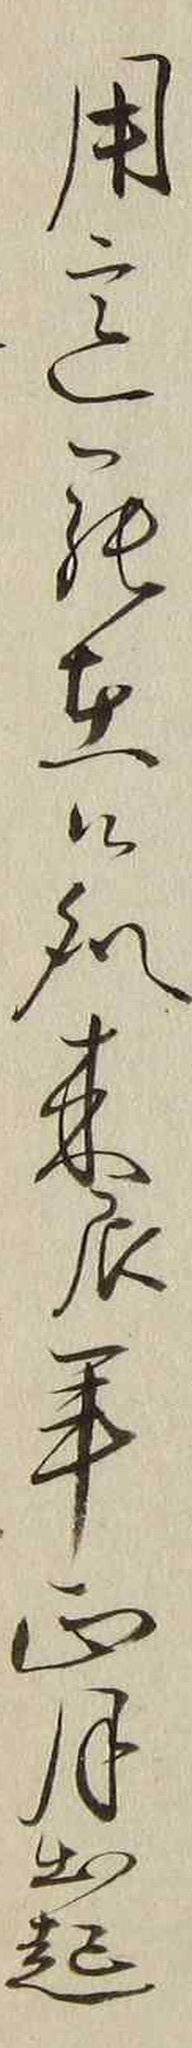用意罷在候処来辰年正月出起
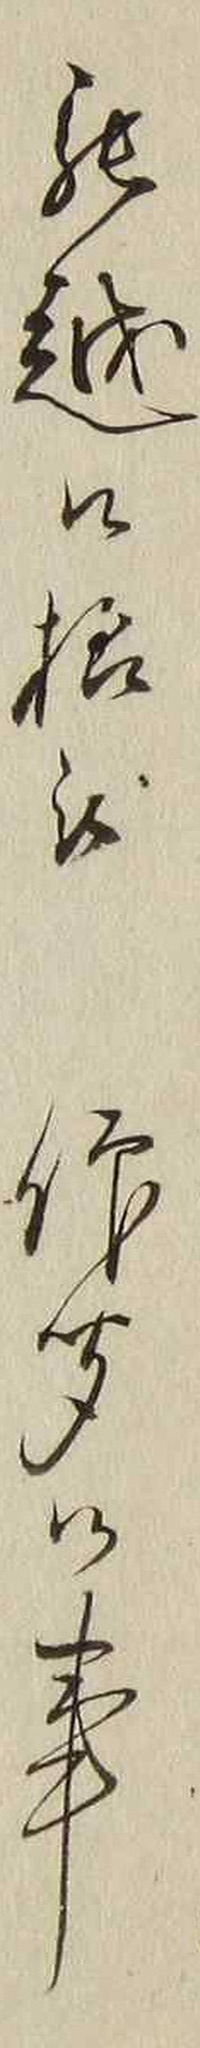罷越候様被仰聞候事
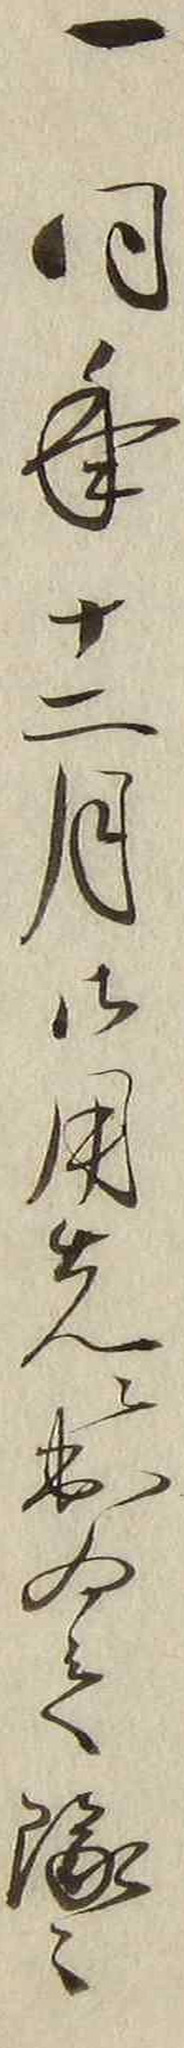一同年十二月御用先におゐて隊々
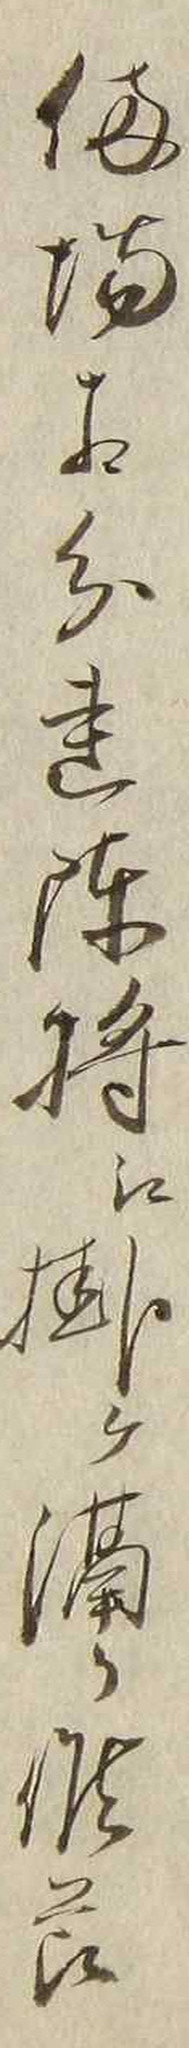備場相分れ陣将江掛ケ隔候節
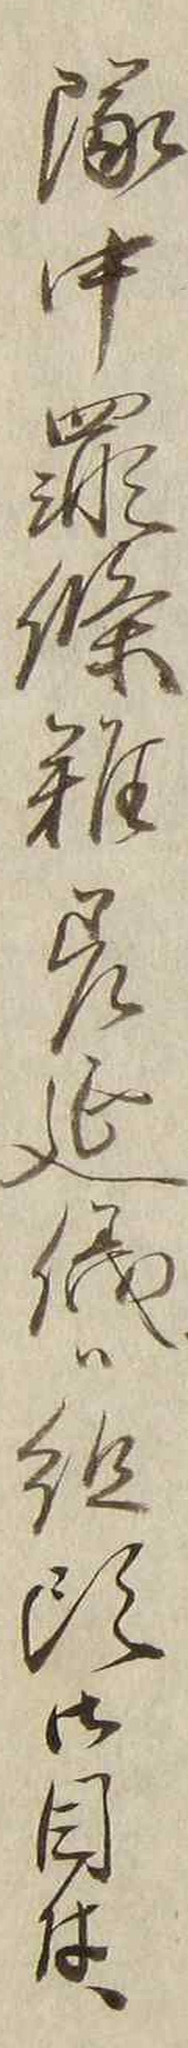隊中罪条難差延儀は組頭御目付へ

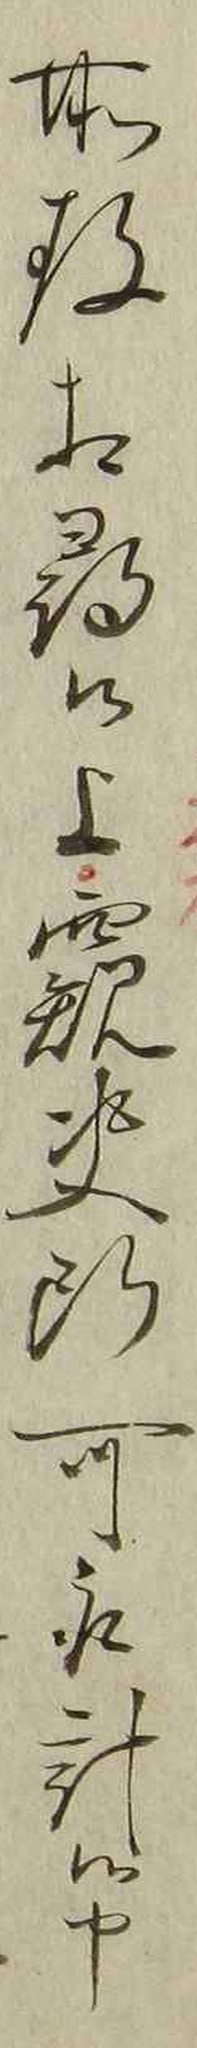所存相尋候上不及窺決断可取計候申
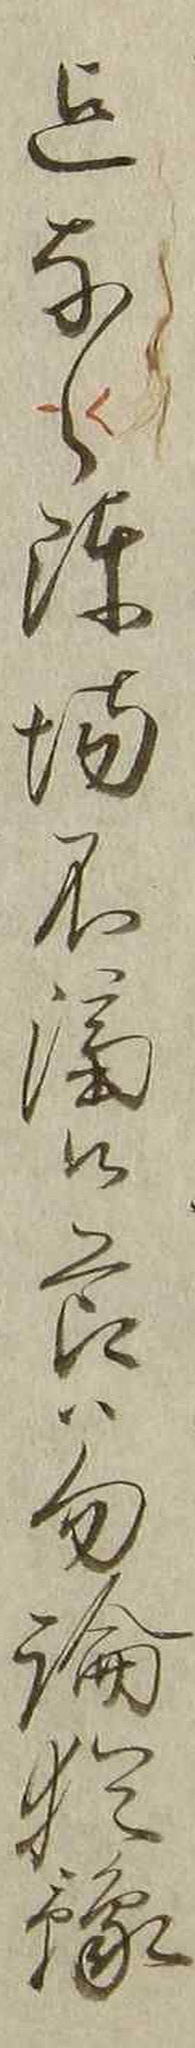迄なく陳場不隔候節は勿論猶予
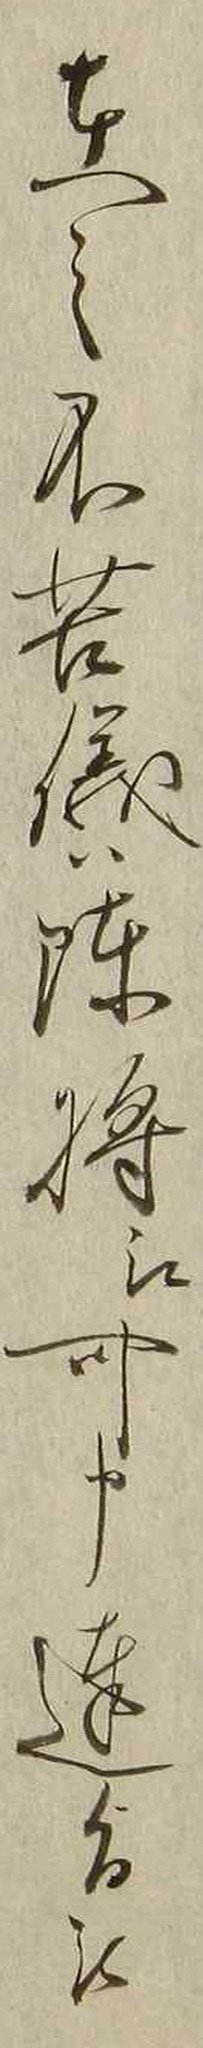在之不苦儀は陳将江可申達旨被
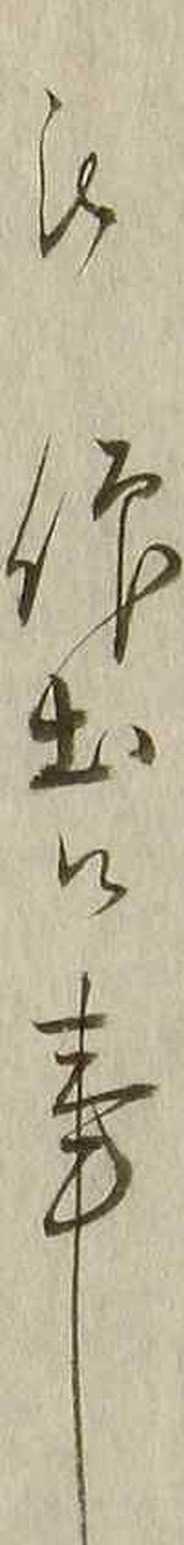被仰出候事
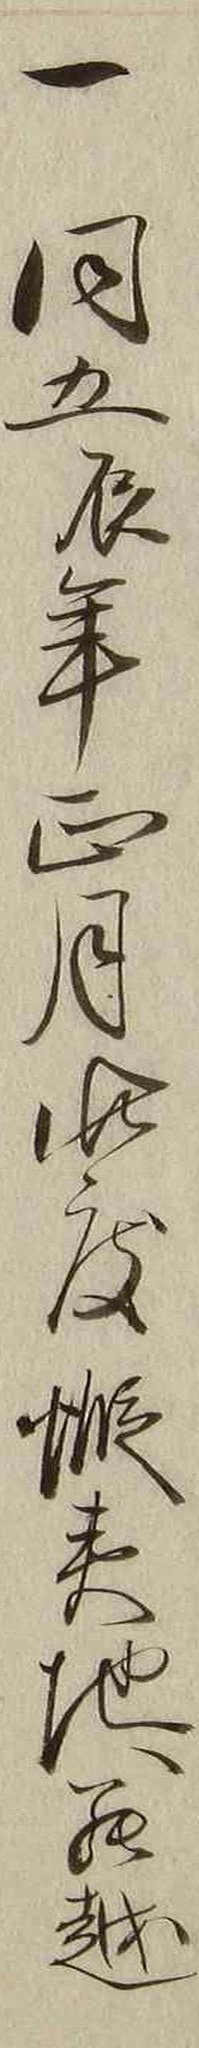一同五辰年正月此度蝦夷地へ罷越
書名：諸士系譜　巻之103　か之部11
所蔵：会津若松市立会津図書館
